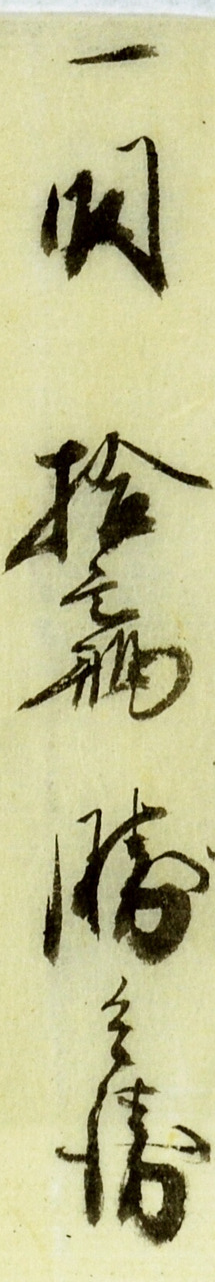一同拾壱瓶勝兵衛
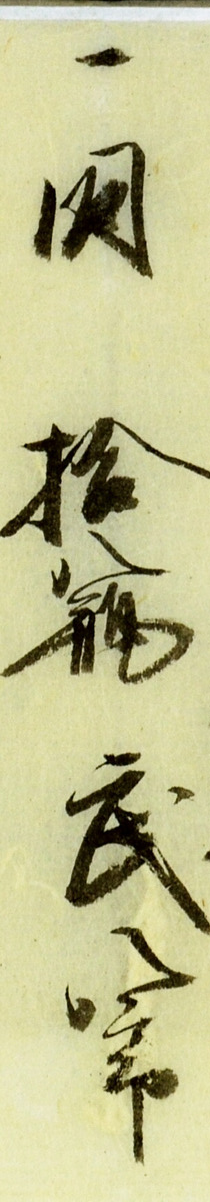一同拾八瓶武八郎
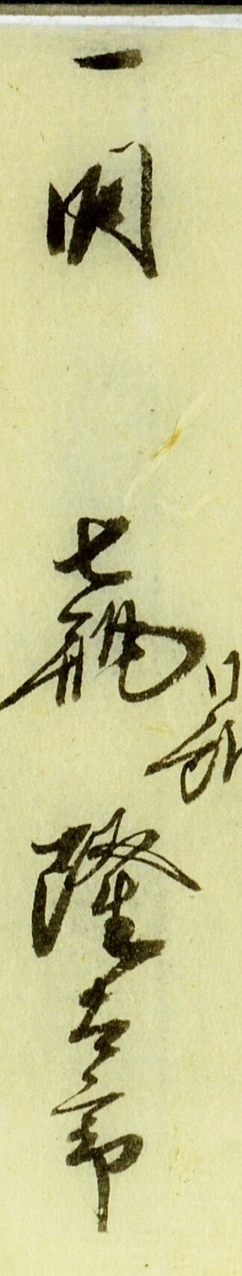一同七瓶隆太郎
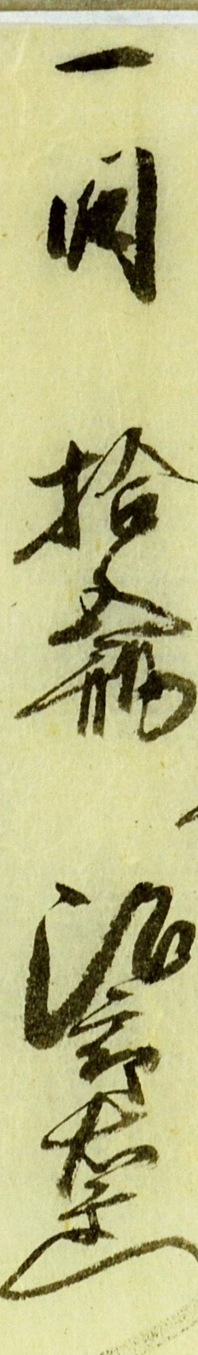一同拾五瓶治郎右衛門
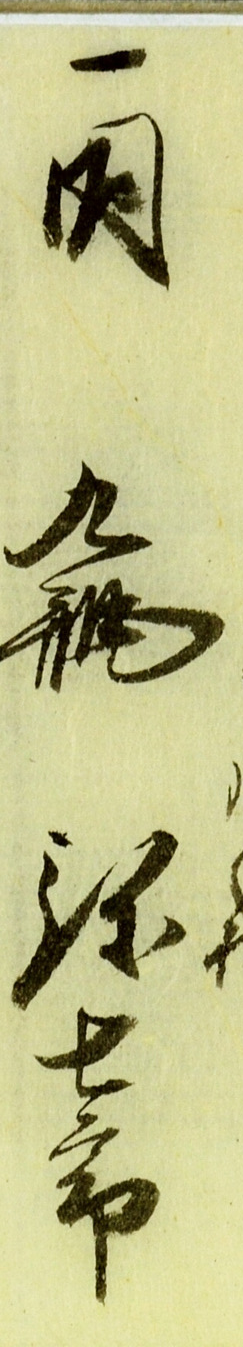一同九瓶弥七郎
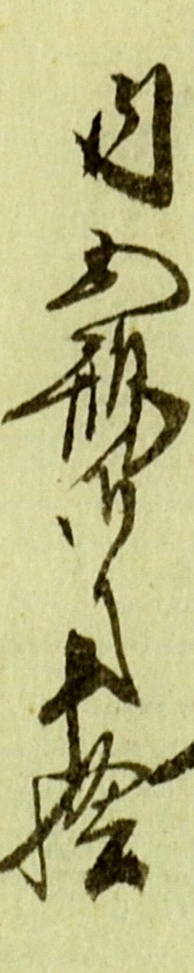内五瓶御用捨
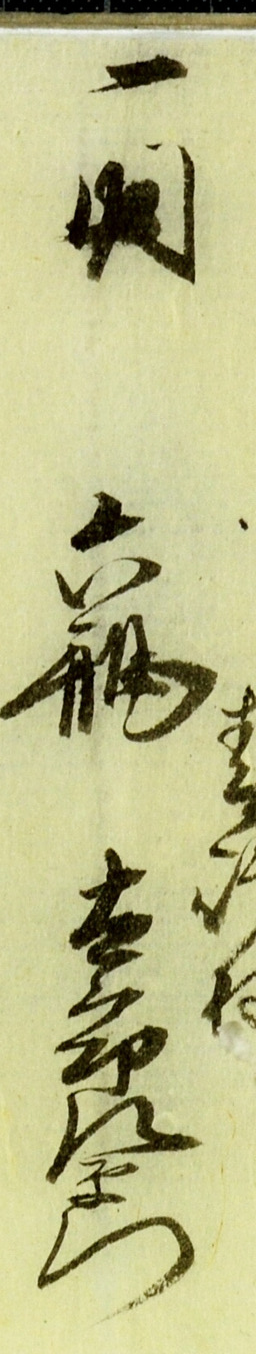一同六瓶太郎左衛門
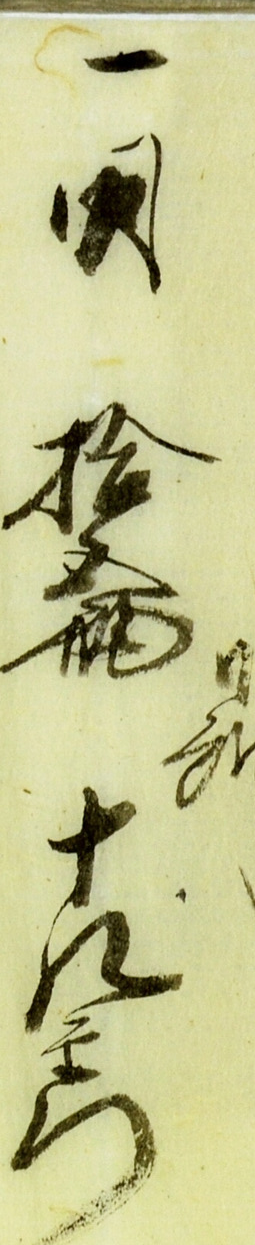一同拾五瓶治郎右衛門

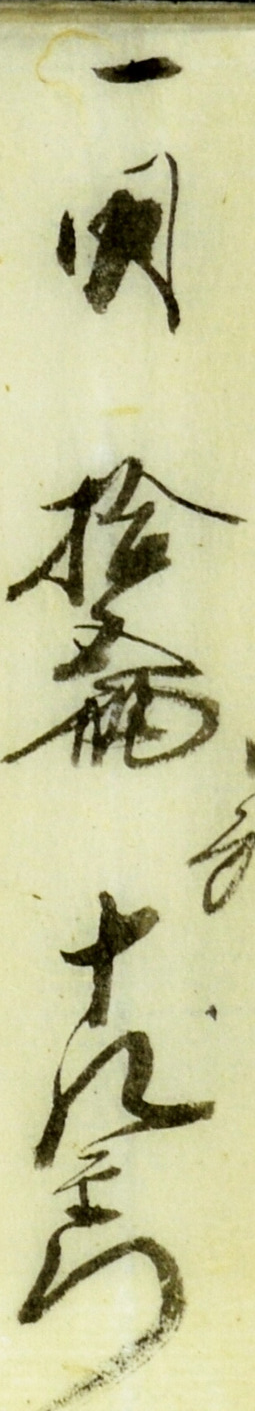一同拾四瓶弥右衛門
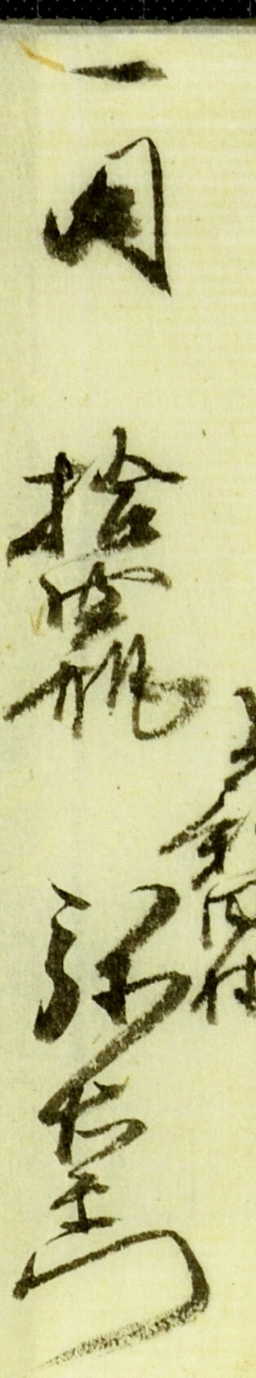一同拾四瓶弥右衛門
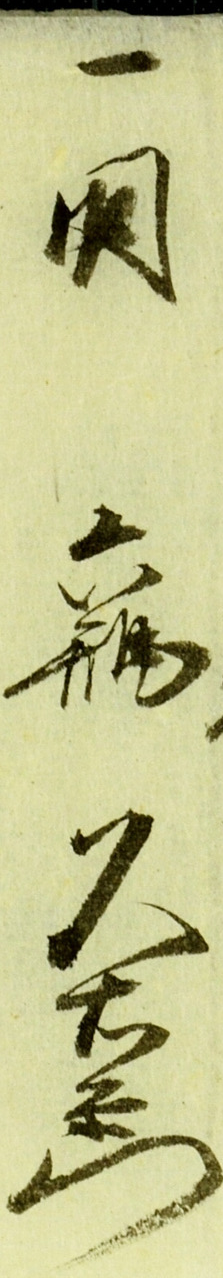一同六瓶久右衛門
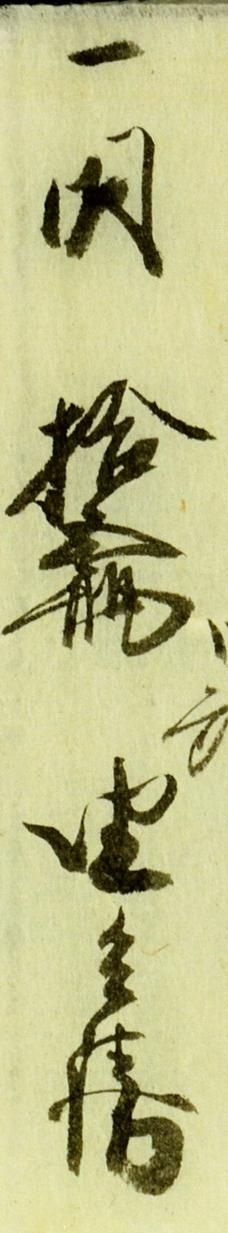一同拾五瓶由兵衛
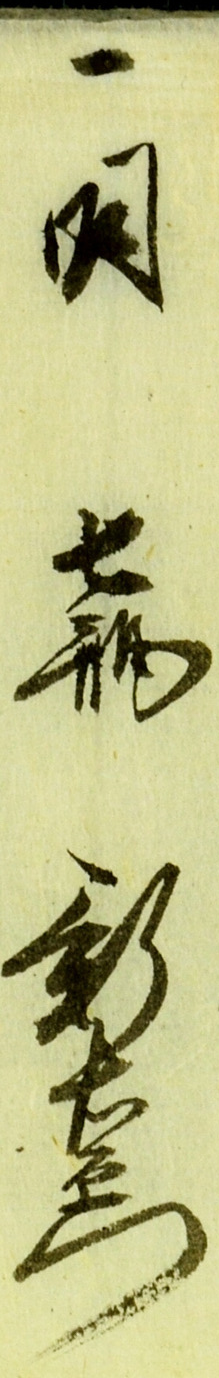一同七瓶新右衛門
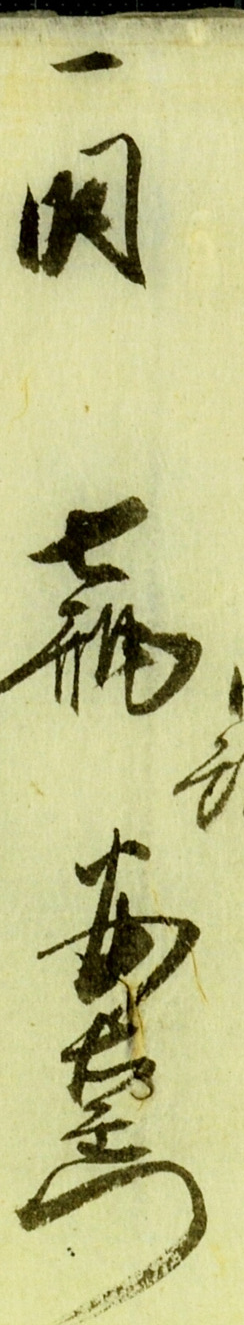一同七瓶安右衛門
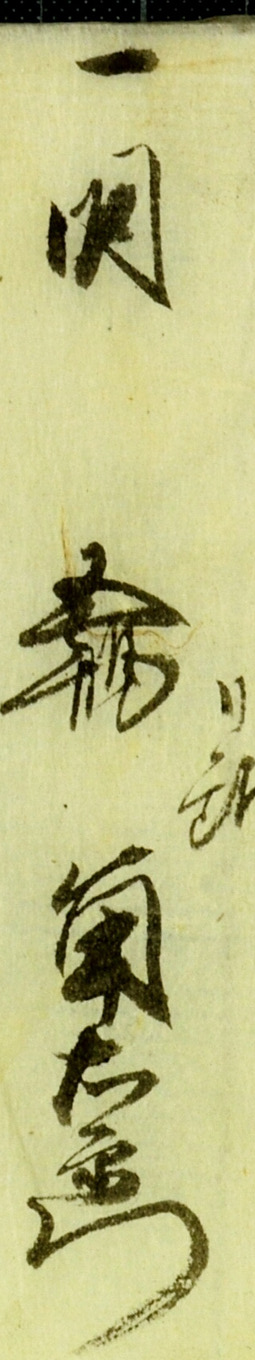一同五瓶角右衛門
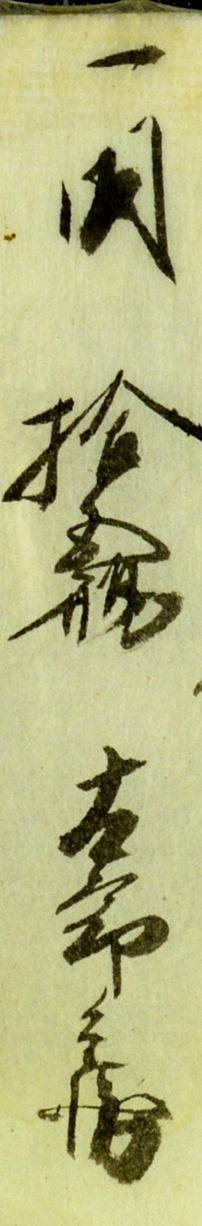一同拾五瓶太郎兵衛
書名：御領分中御領分中紺屋藍瓶員数御改帳
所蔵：伊那市立高遠町図書館・合同会社AMANE
